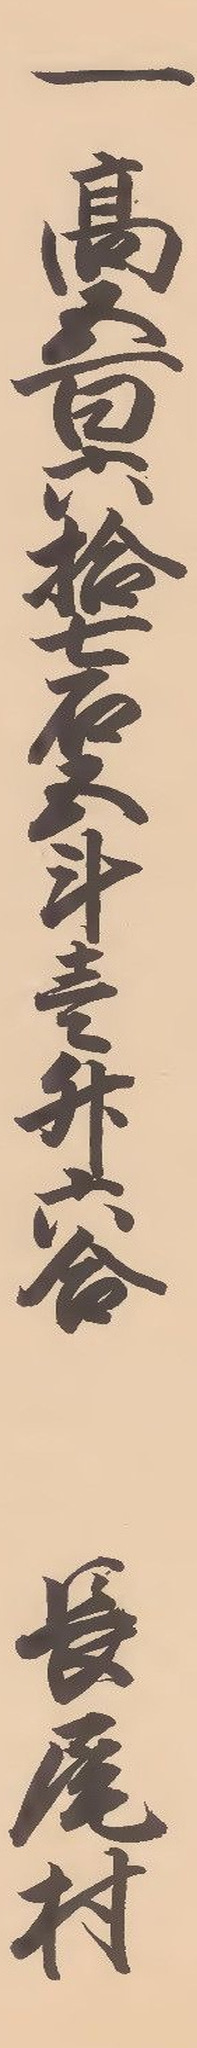一高五百六拾七石五斗壱升六合長尾村
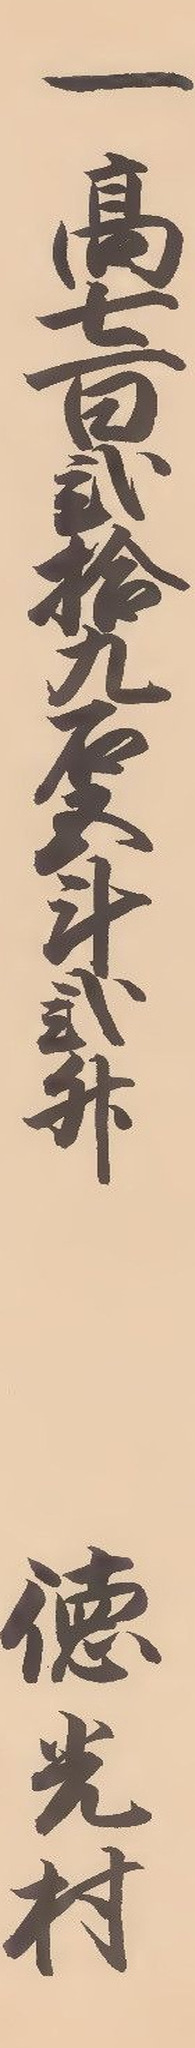一高七百弐拾九石五斗弐升徳光村
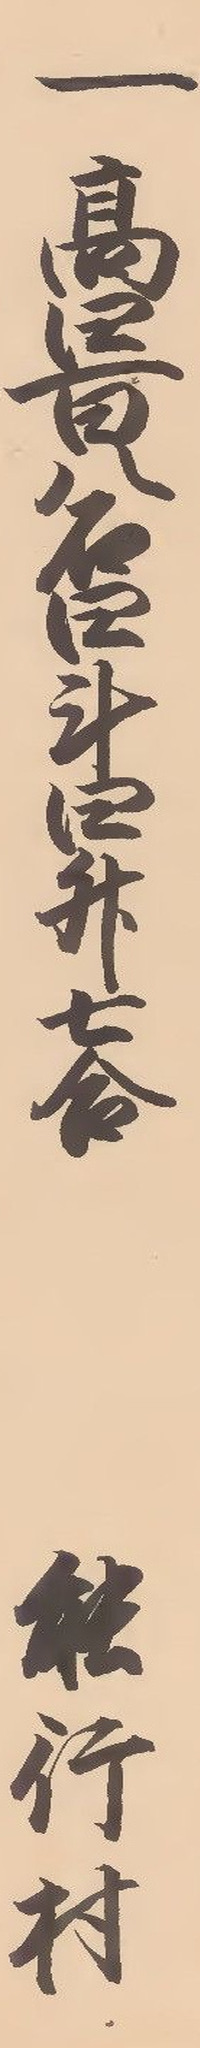一高四百八石四斗四升七合能行村
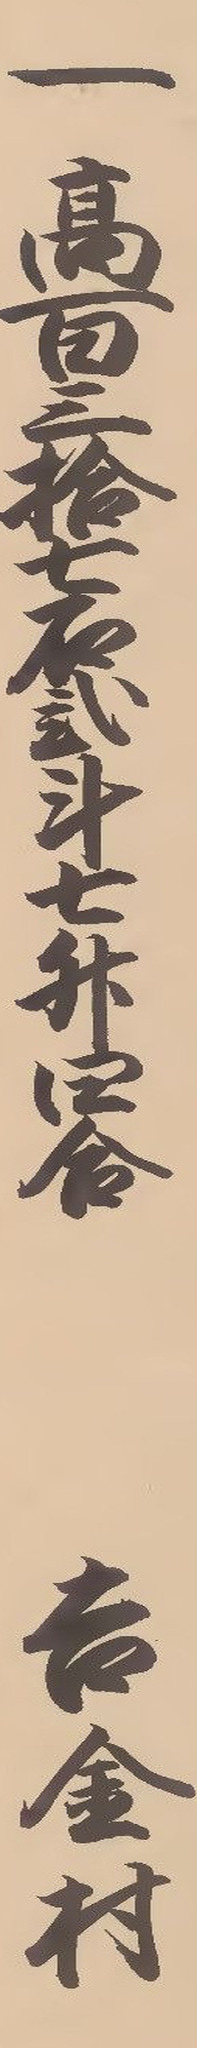一高百三拾七石弐斗七升四合吉金村
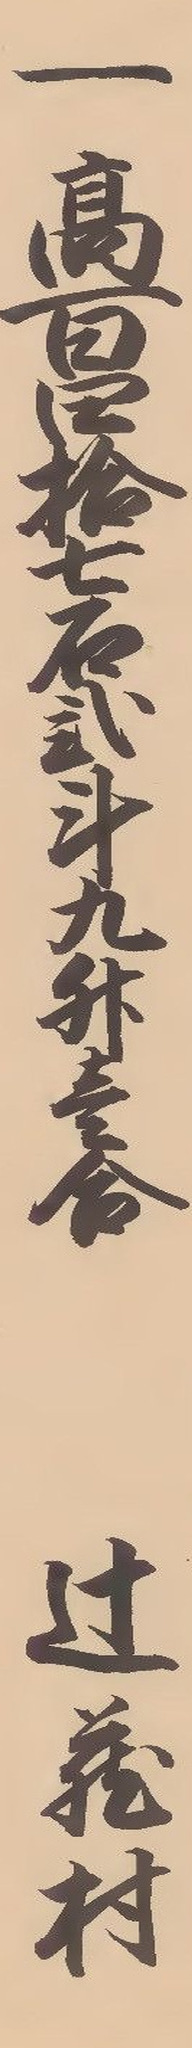一高百四拾七石弐斗九升壱合辻藏村
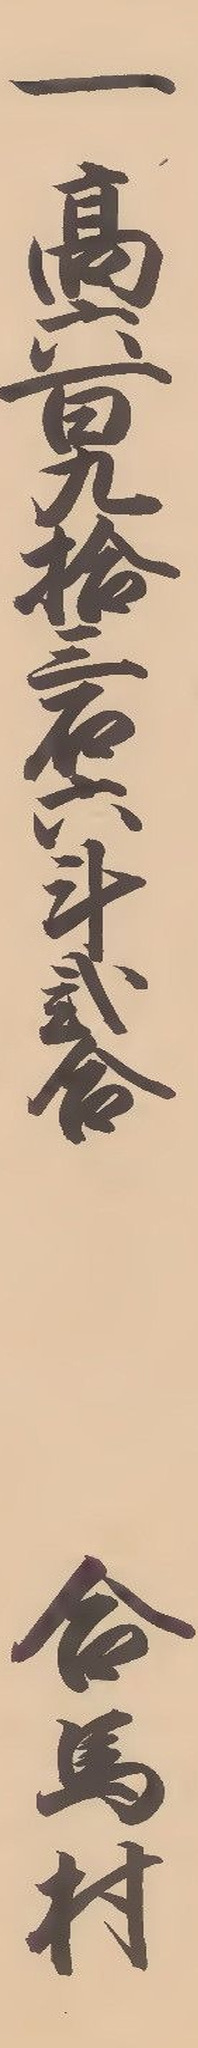一高六百九拾三石六斗弐合合馬村
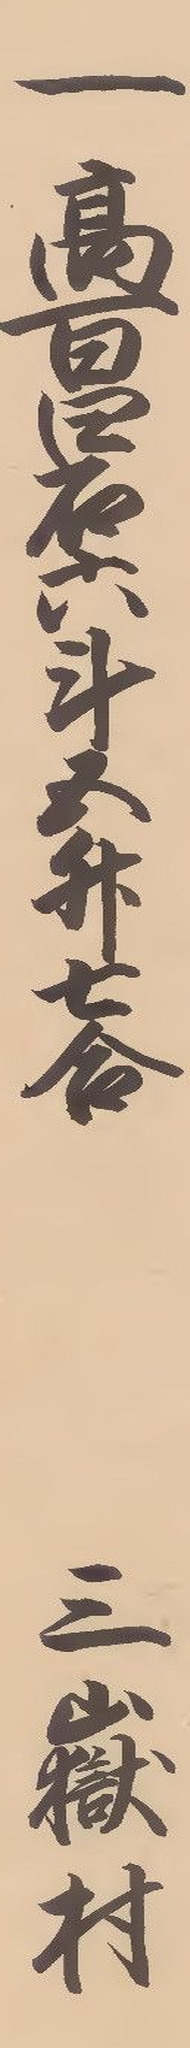一高百四石六斗五升七合三嶽村

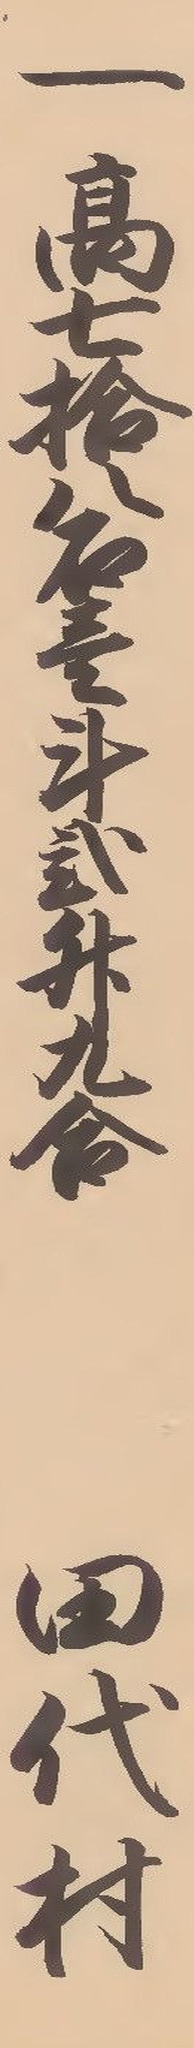一高七拾八石壱斗弐升九合田代村
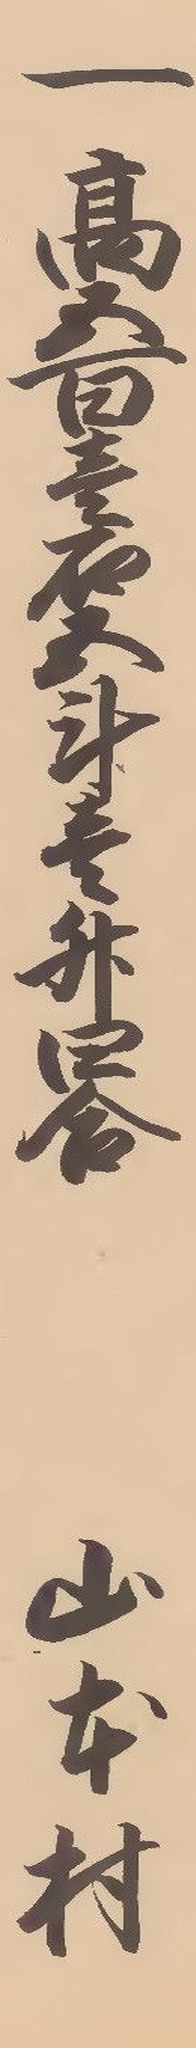一高五百壱石五斗壱升四合山本村
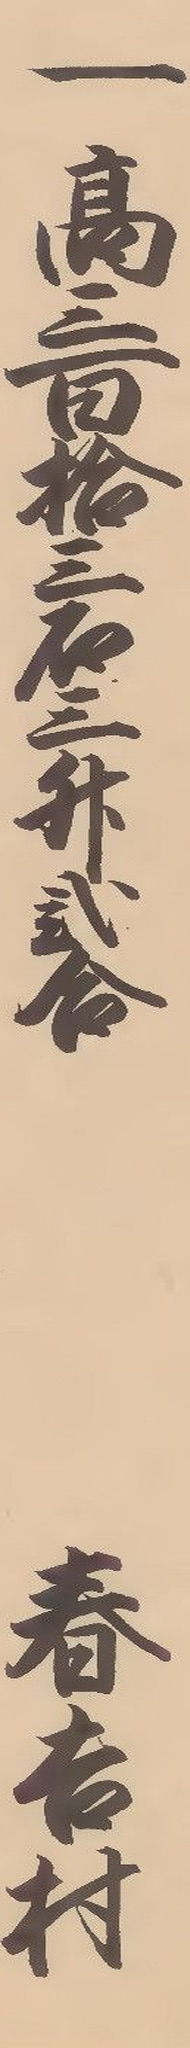一高三百拾三石三升弐合春吉村
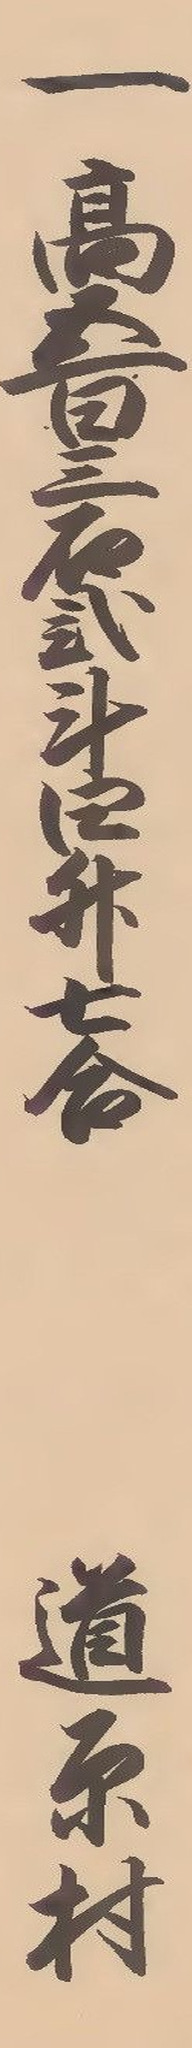一高五百三石弐斗四升七合道原村
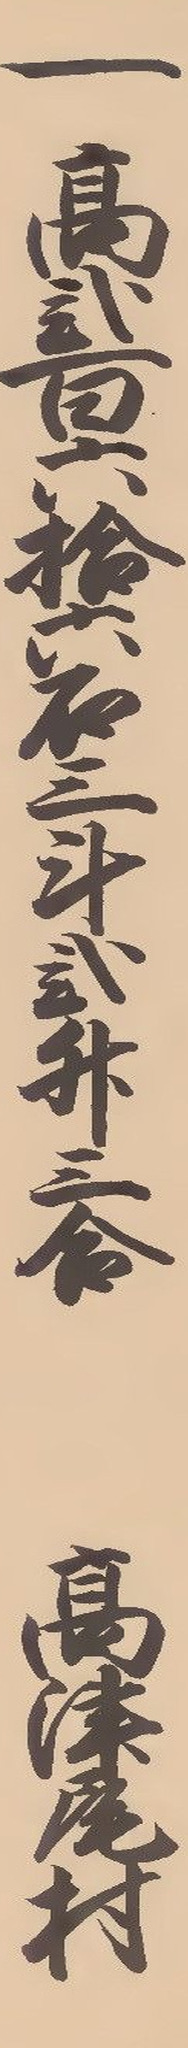一高弐百六拾六石三斗弐升三合髙津尾村
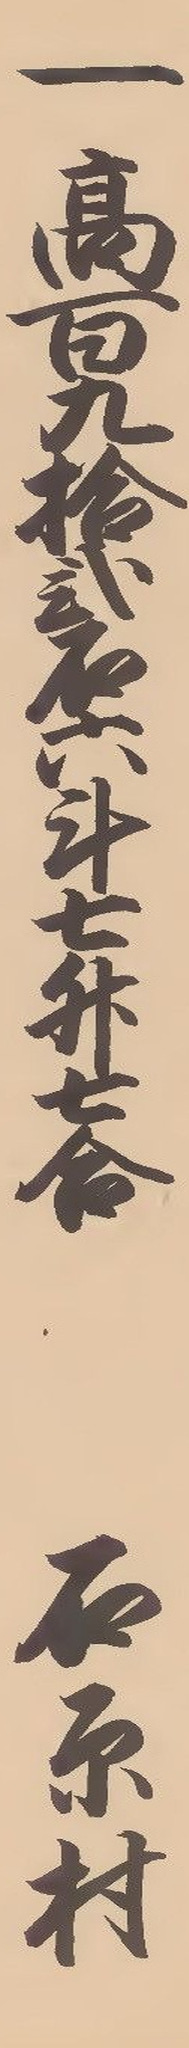一髙百九拾弐石六斗七升七合石原村
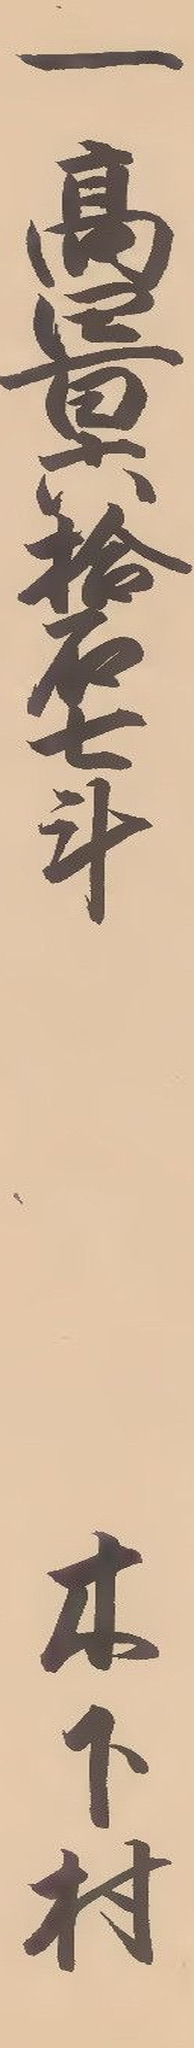一髙四百六拾石七斗木下村
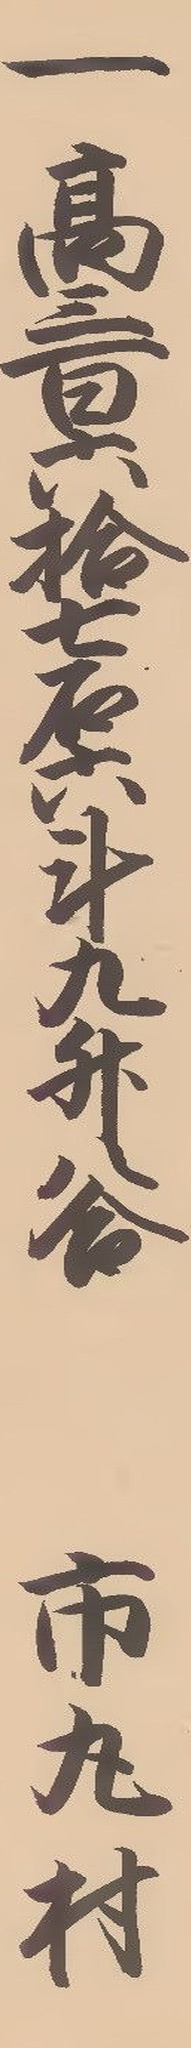一髙三百六拾七石六斗九升八合市丸村

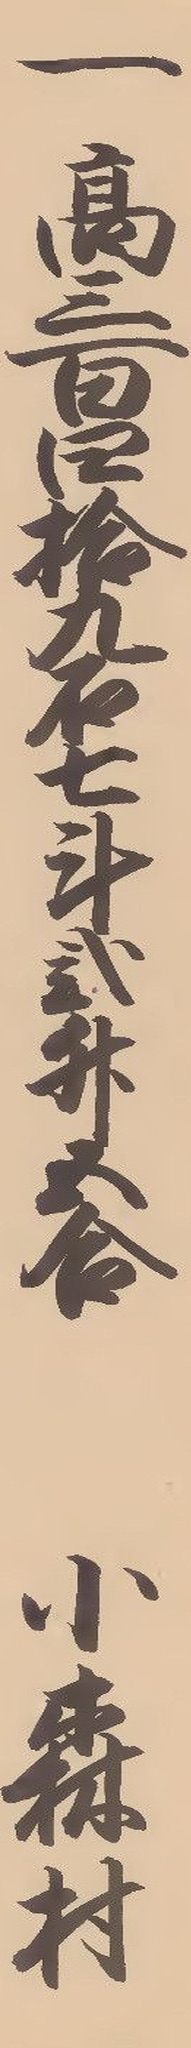一髙三百四拾九石七斗弐升五合小森村
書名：豊前国郷帳
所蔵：国立公文書館 National Archives of Japan
